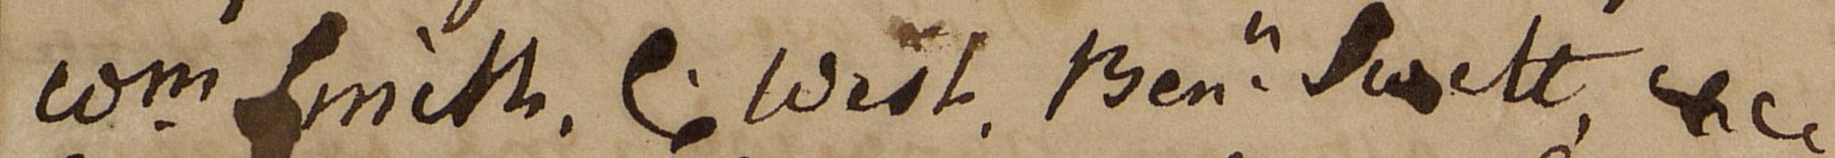W^m. Smith, C. West, Ben^n. Swett, &c
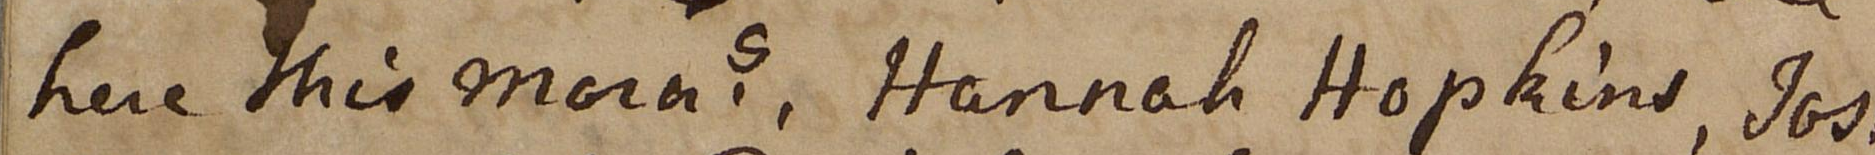here this morn^g., Hannah Hopkins, Jos:
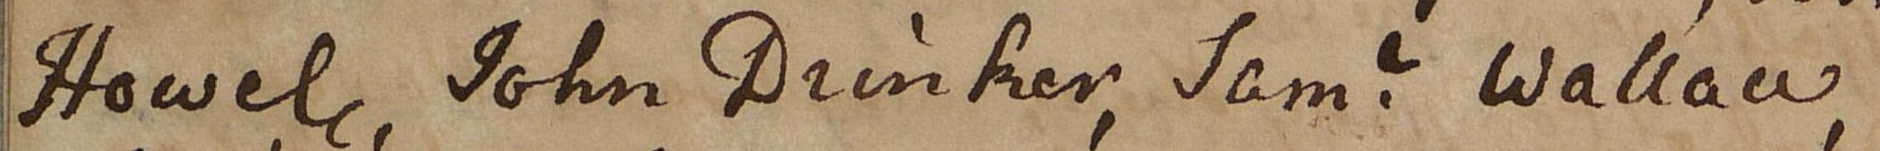Howel, John Drinker, Sam^l. Wallace,
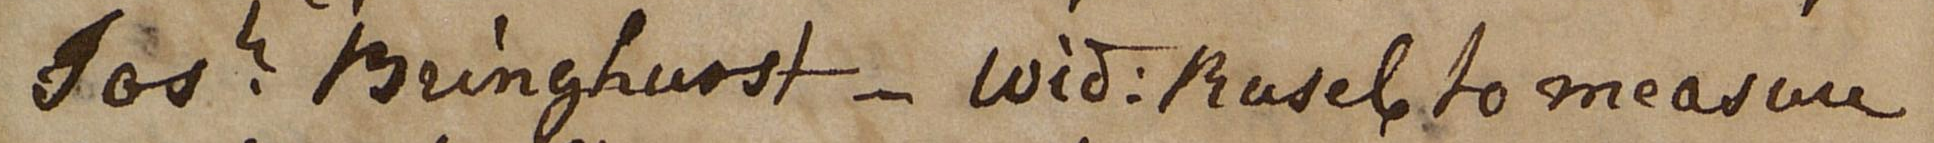Jos^h. Bringhurst- Wid: Rusel to measure
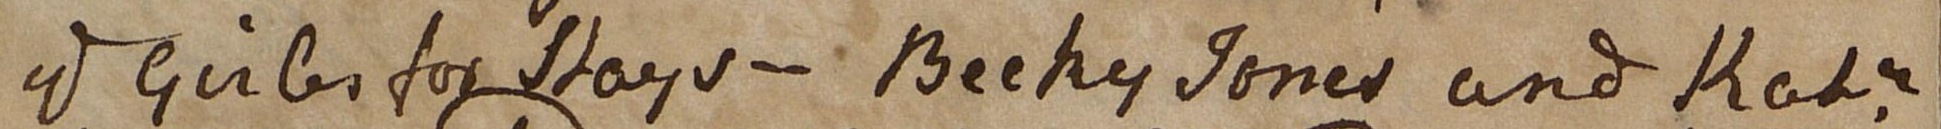y^e Girles for Stays- Becky Jones and Kat^y.
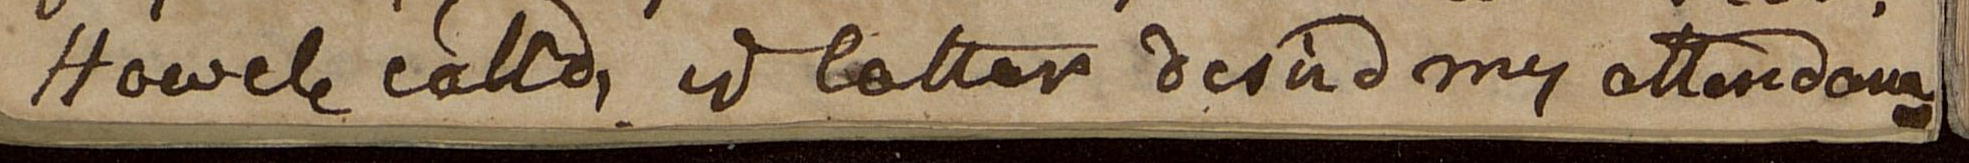Howel call'd, y^e latter desird my attendanc
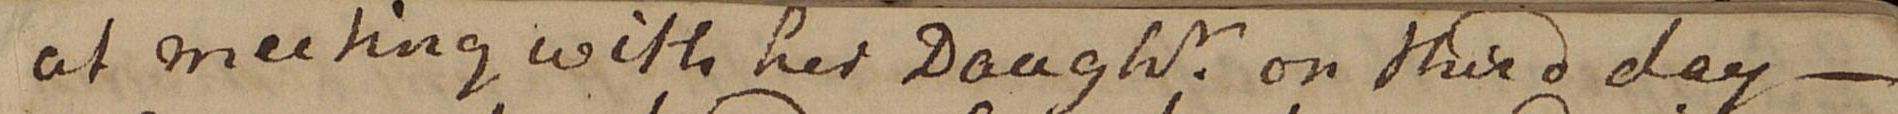at meeting with her Daugh^r. on third day-
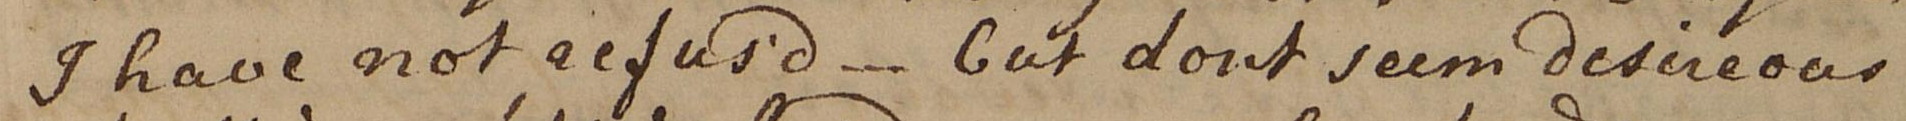I have not refus'd- but dnt seem desireous
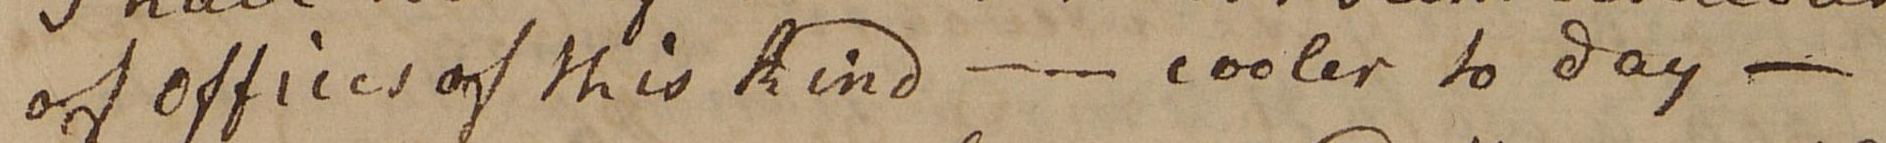of offices of this kind- cooler to day-
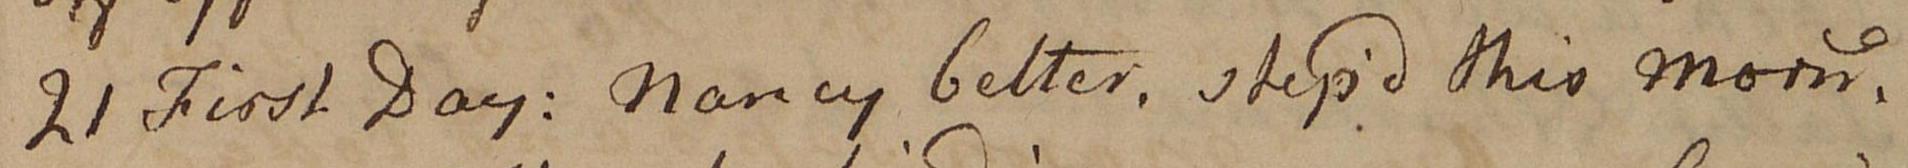21 First Day: Nancy better, step'd this morn^g.
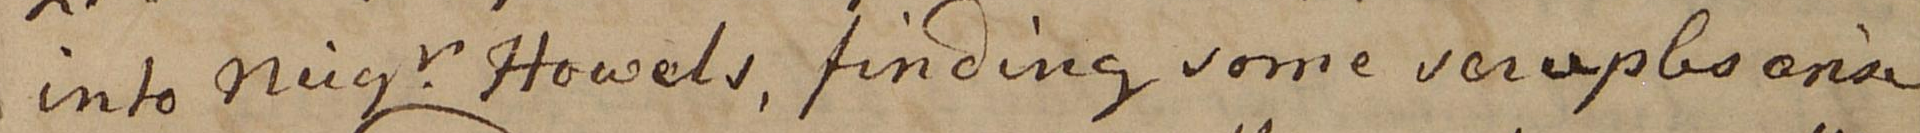into Neig^r. Howels, finding some scuples arise
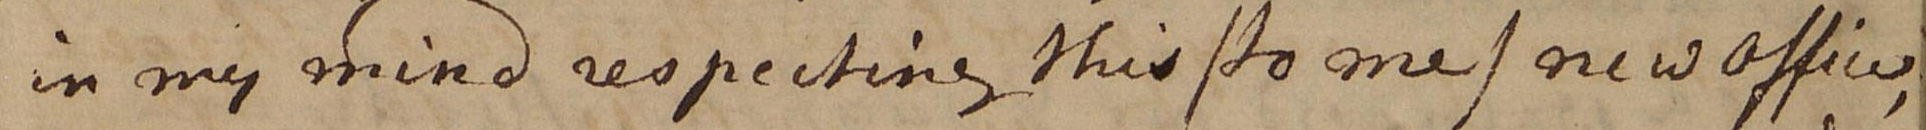in my mind respecting this to me (new office,
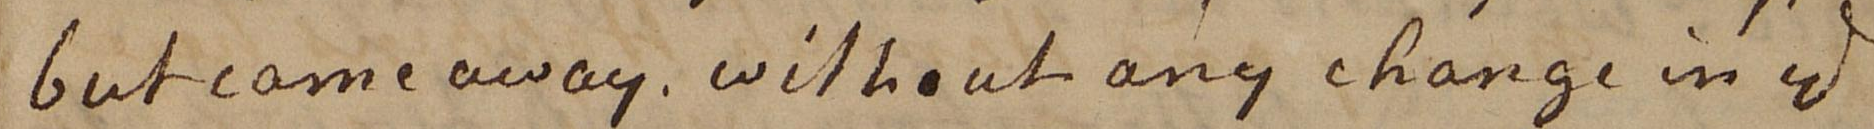but came away, without any change in y^e
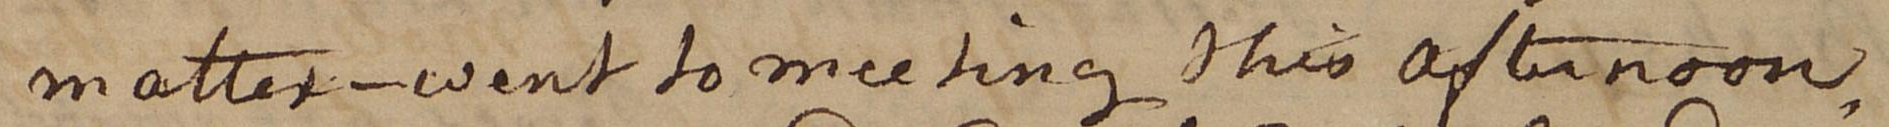matter- went to meeting this afternoon,
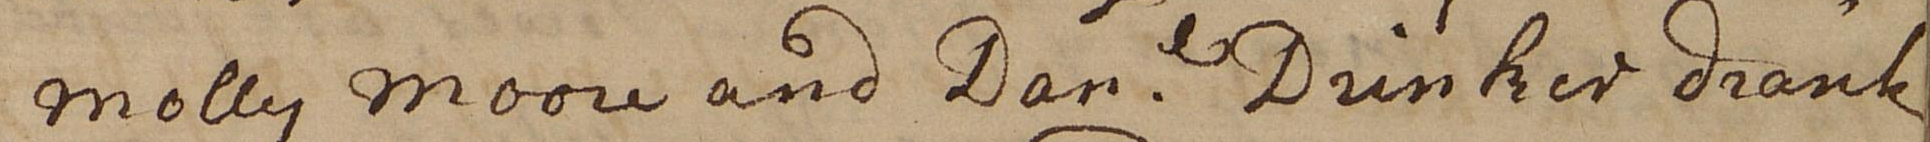Molly Moore and Dan^l. Drinker drank
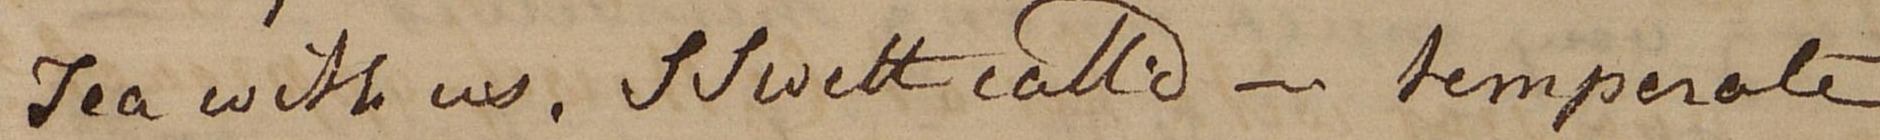Tea with us. S Swett call'd- temperate
